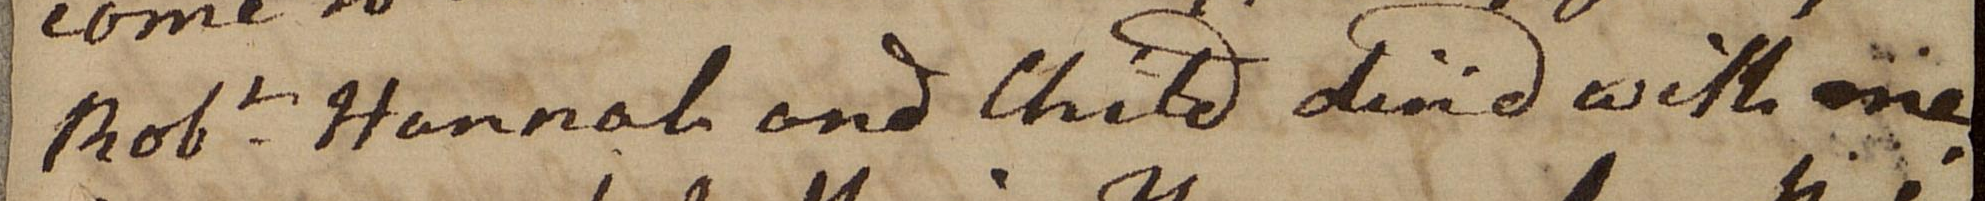Rob^t. Hannah and Child din'd with one,
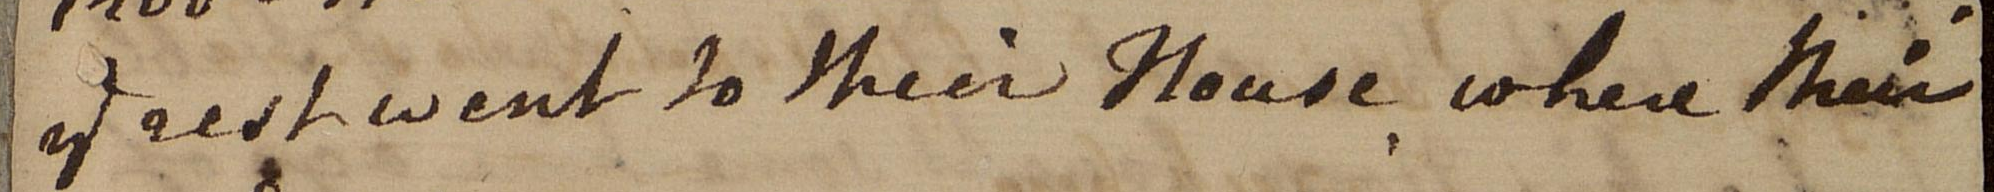y^e rest went to their House, where their
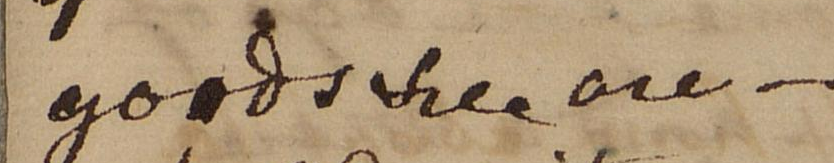goods &c are-
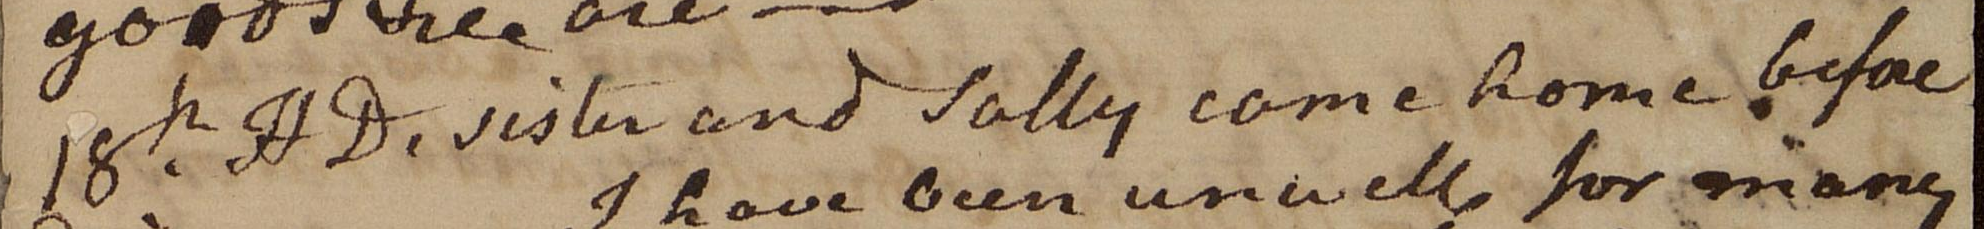18^th. HD. sister and Sally came home before
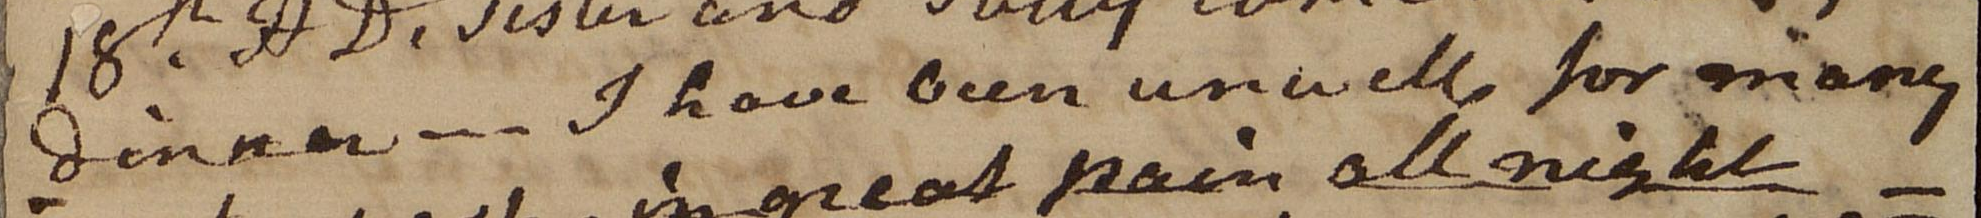dinner- I have been unwell for many
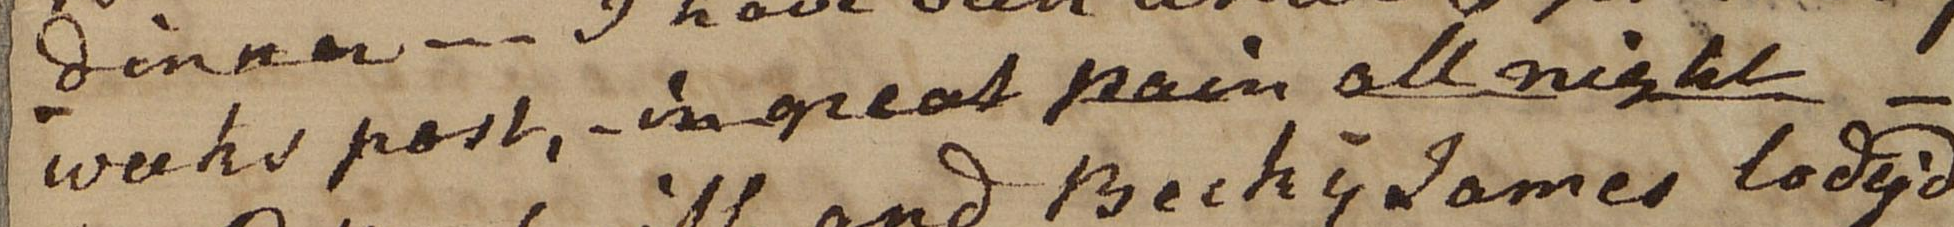weeks past,- in great pain all night-
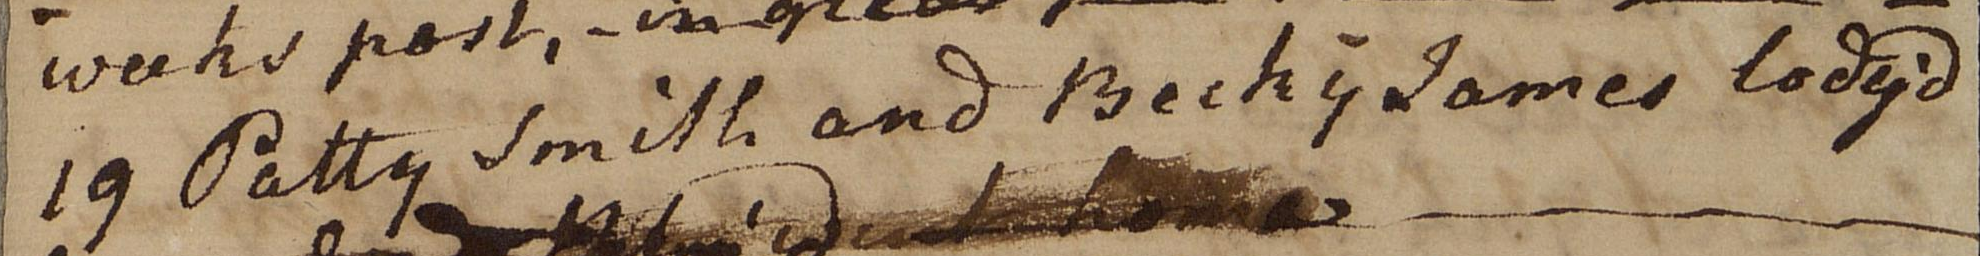19 Patty Smith and Becky James lodg'd
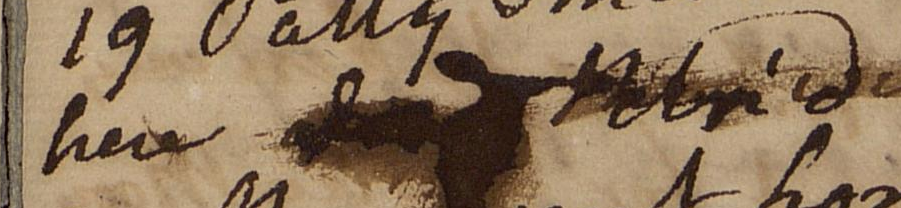here [________]'d
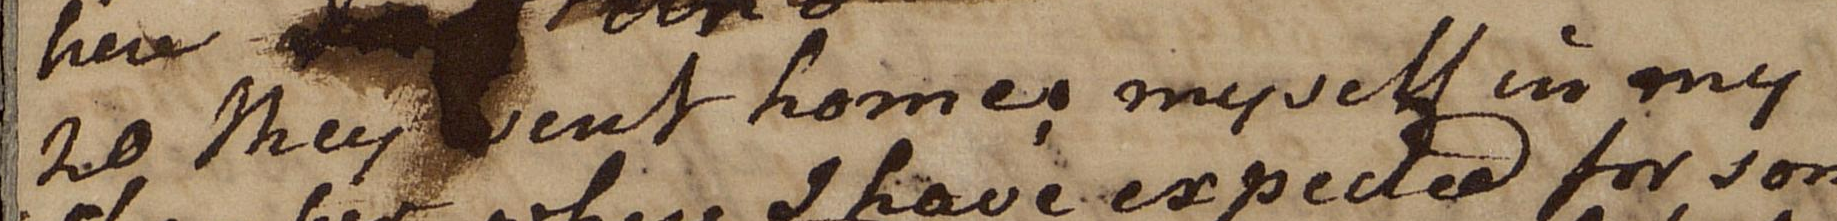20 they sent home: myself in my
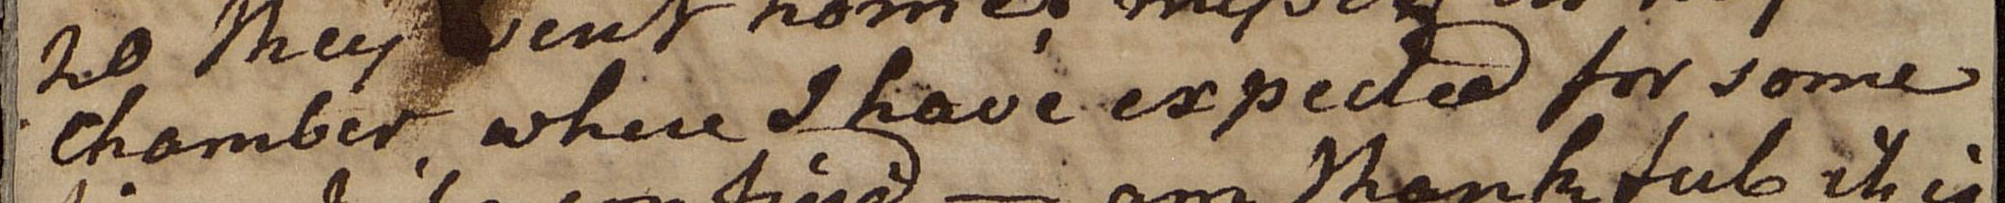chamber, where I have expected for some
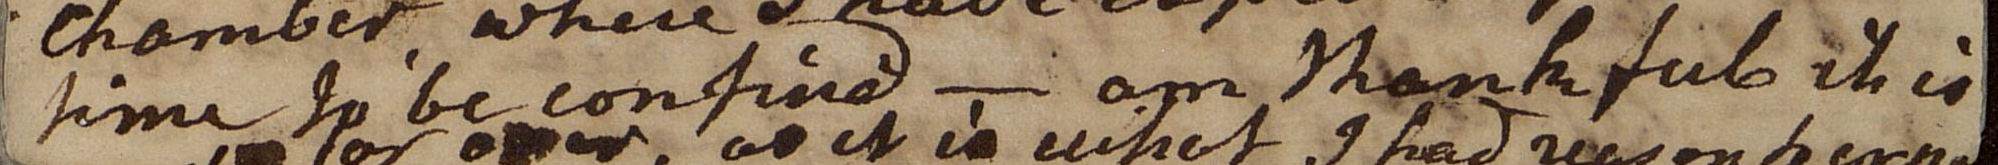time to be confin'd-, am thankful it is
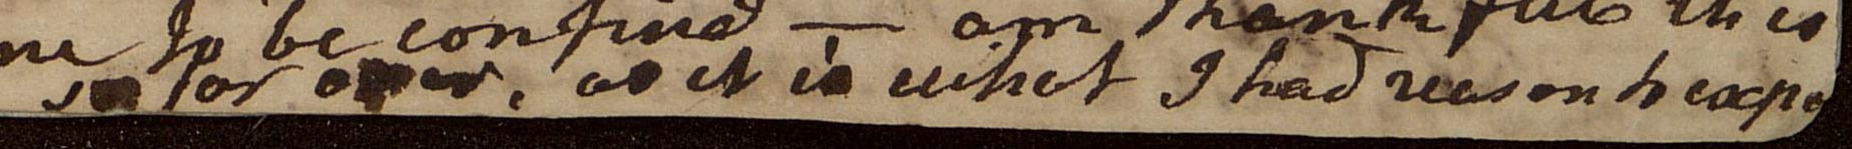so far over, as it is what I had reason to exp[_]
